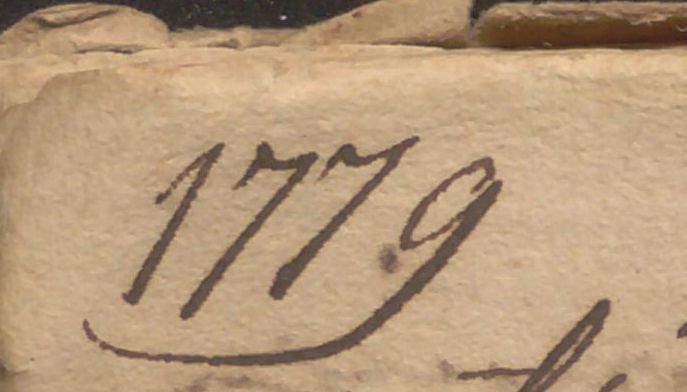1779
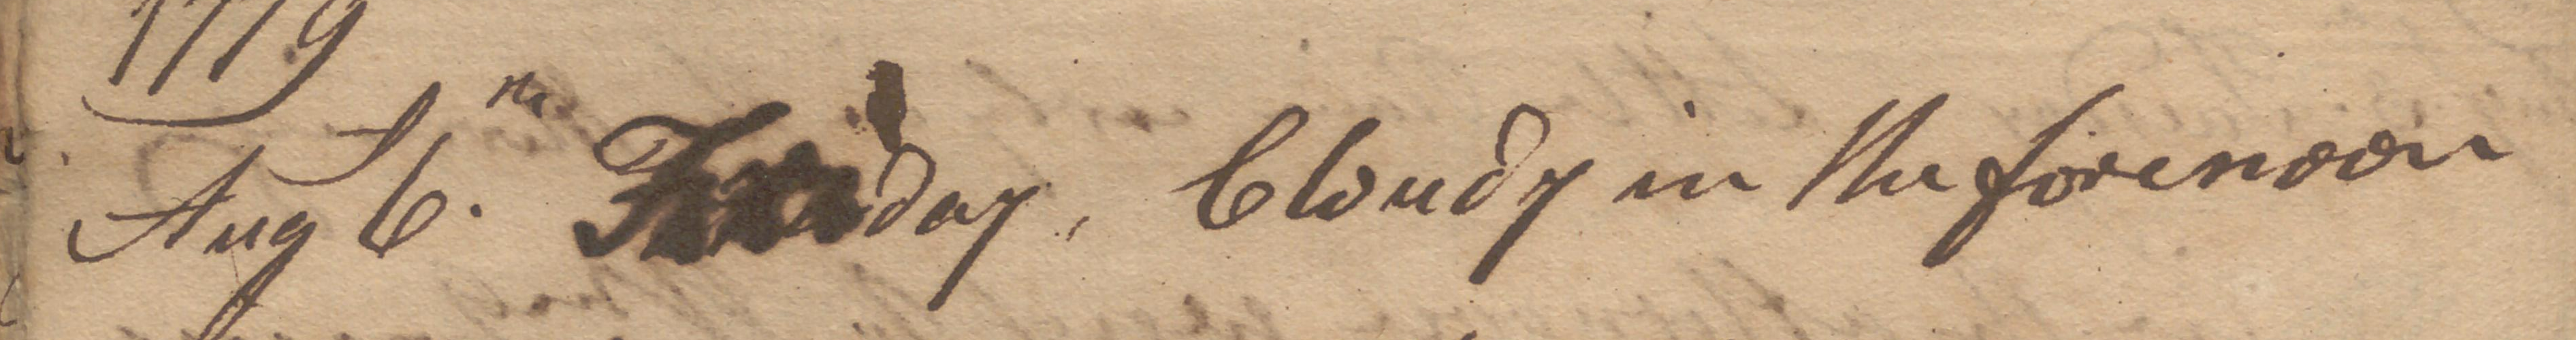Aug 6^th. Friday, Cloudy in the forenoon
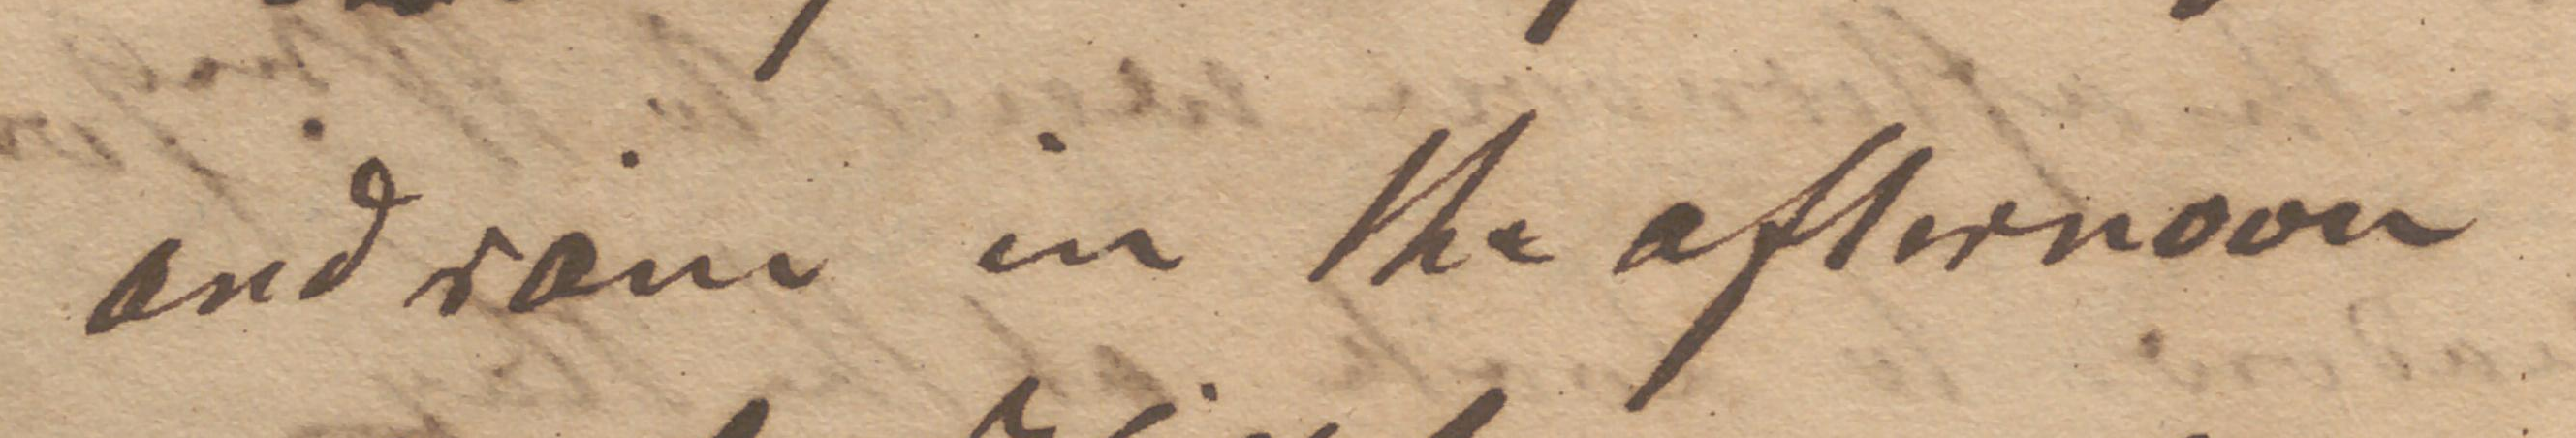and rain in the afternoon
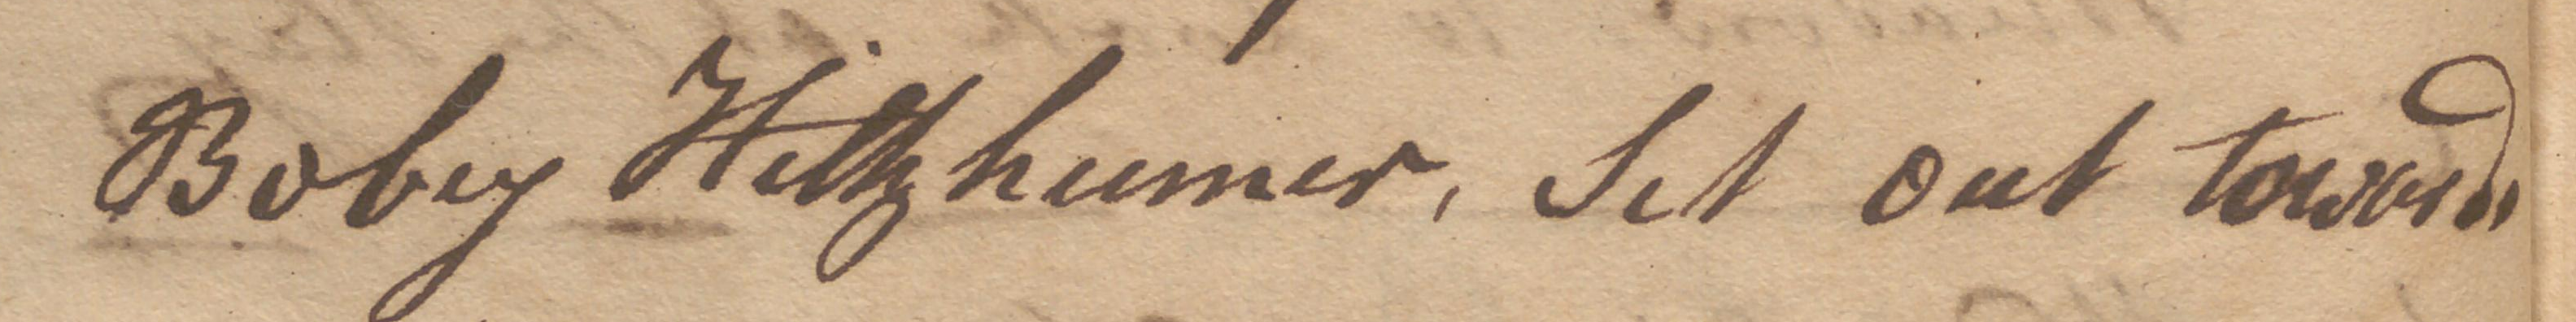Bobey Hiltzheimer, Set out towards
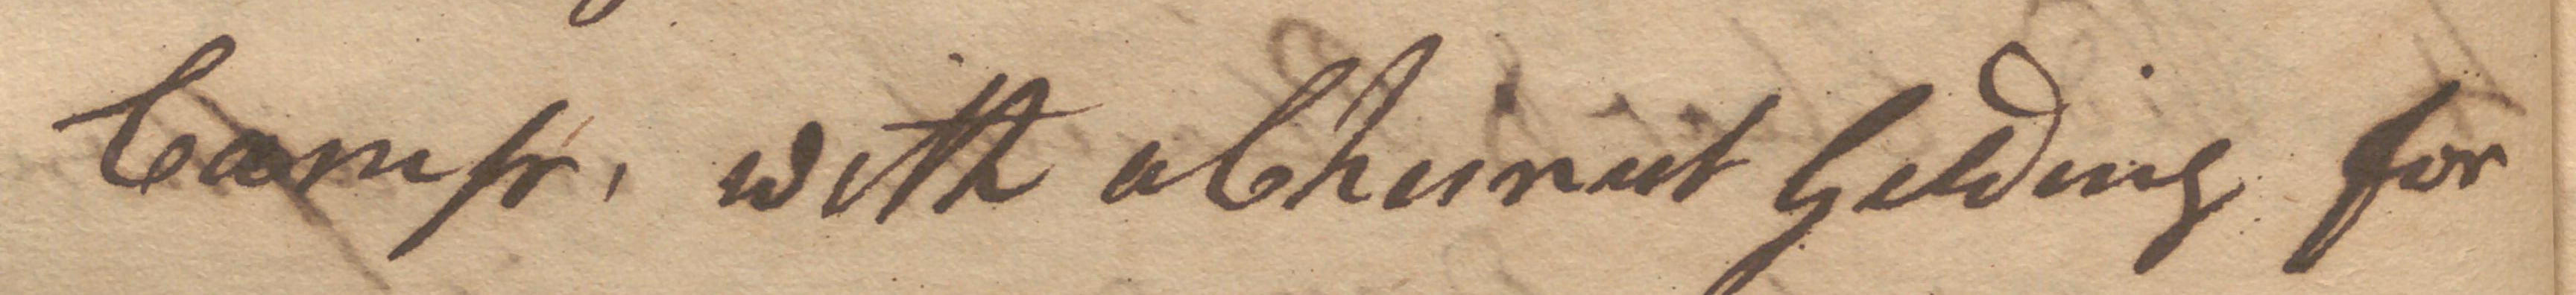Camp, with a Chesnut Gelding for
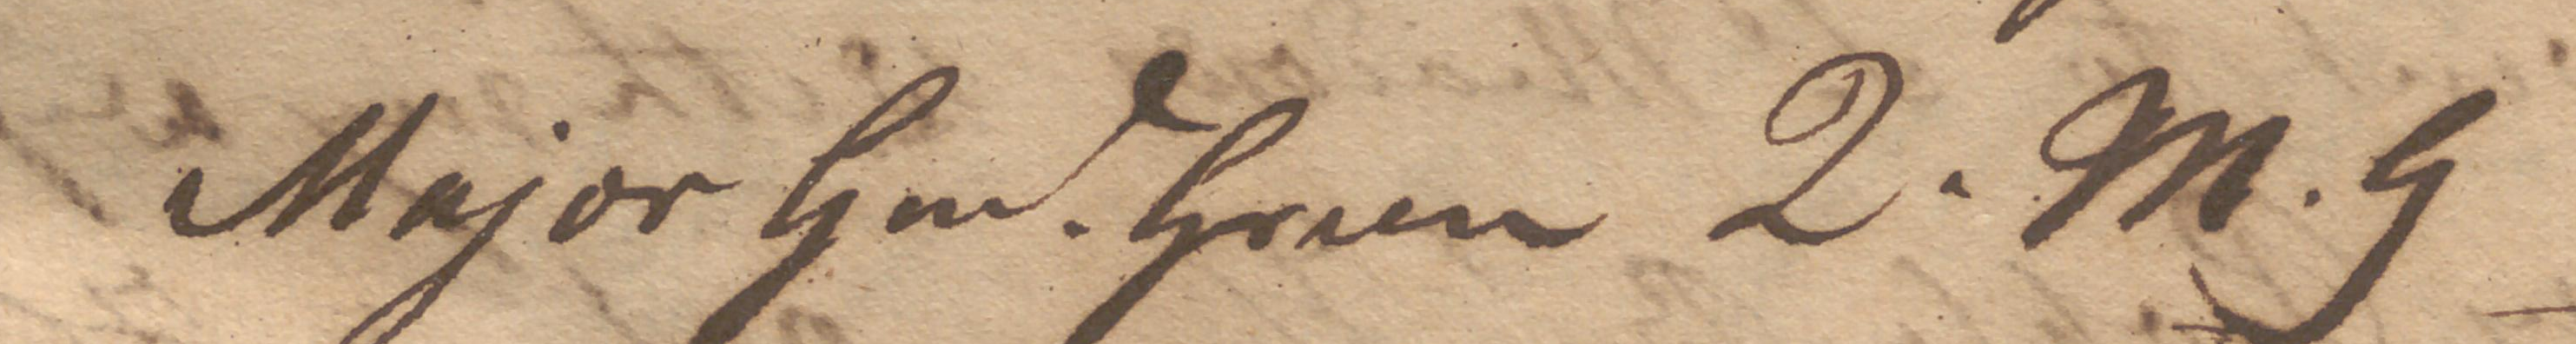Major Gou^l. Green Q.W.G
